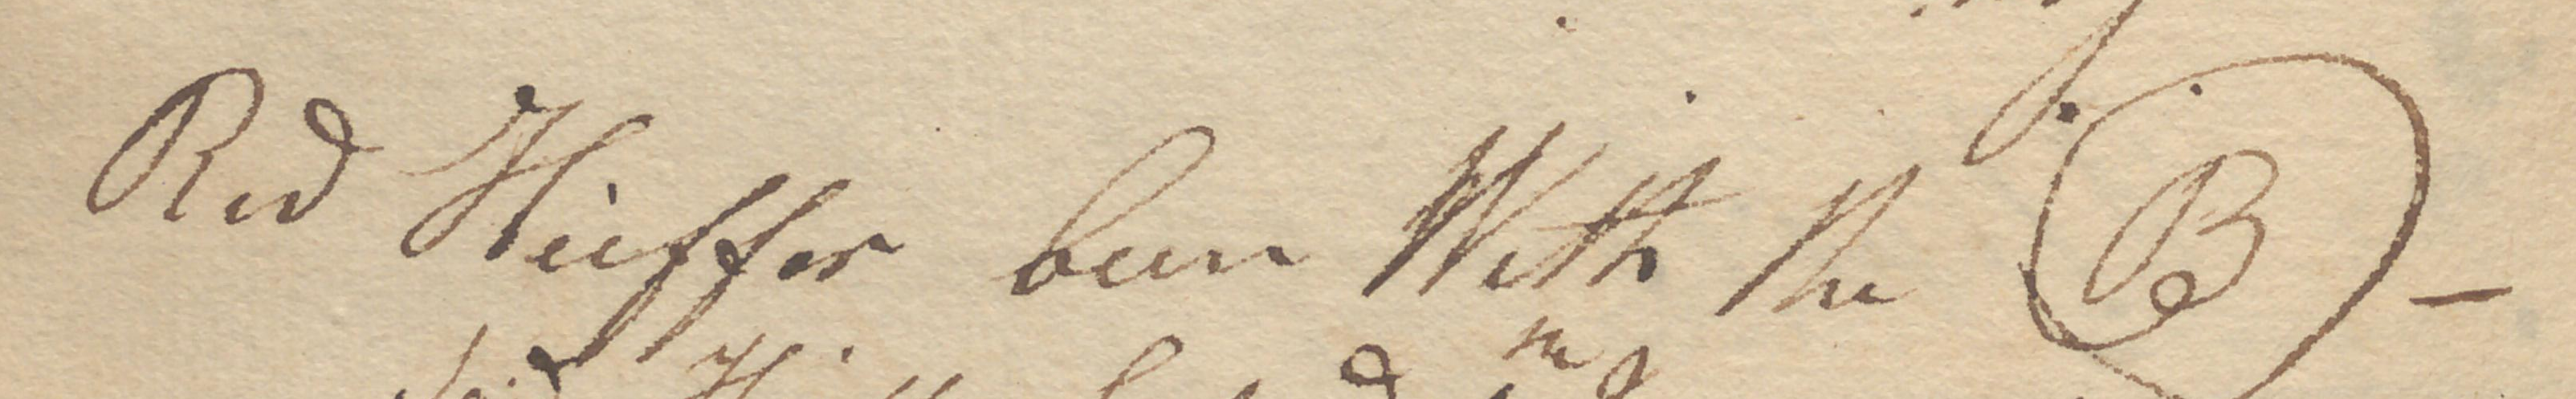Red Heiffer been With the B-
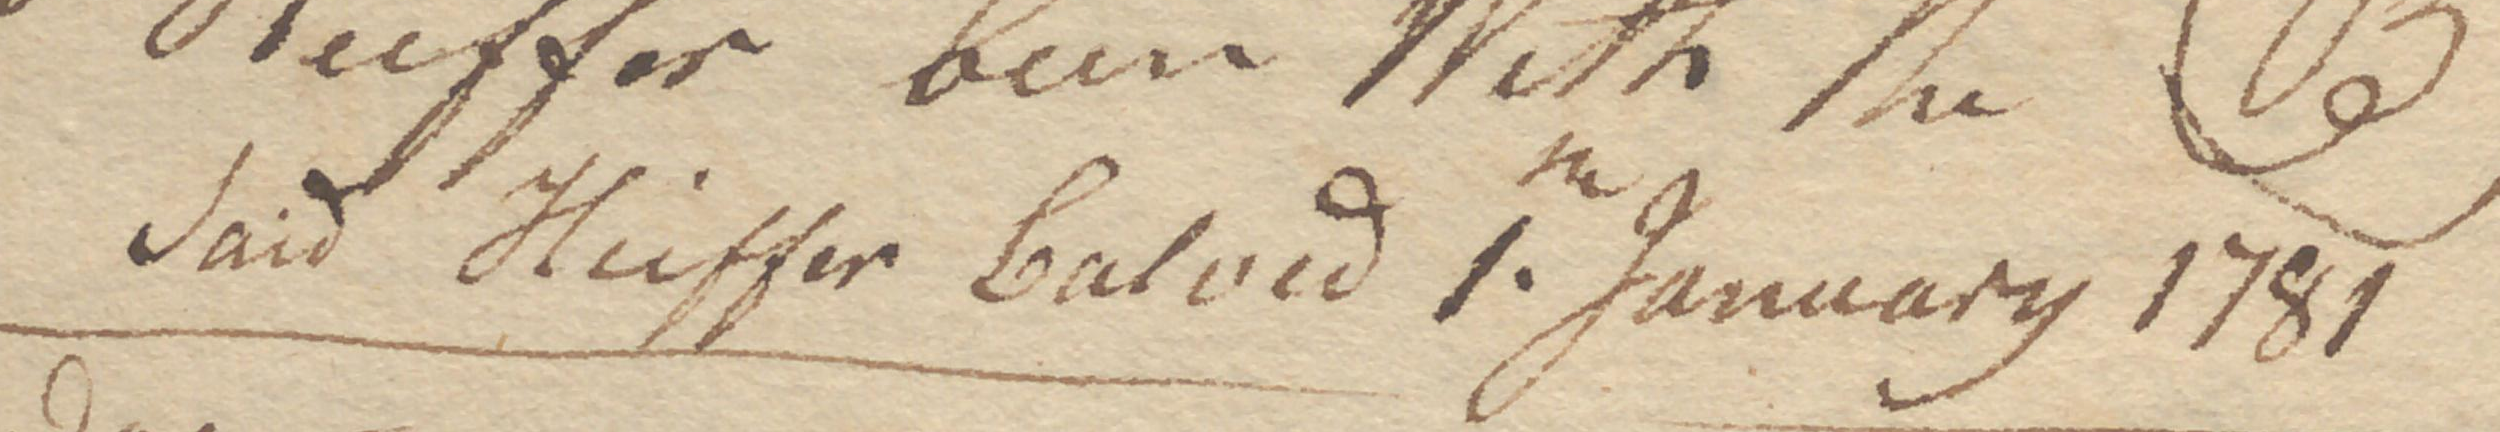Said Heiffer Calved 1^th. January 1781
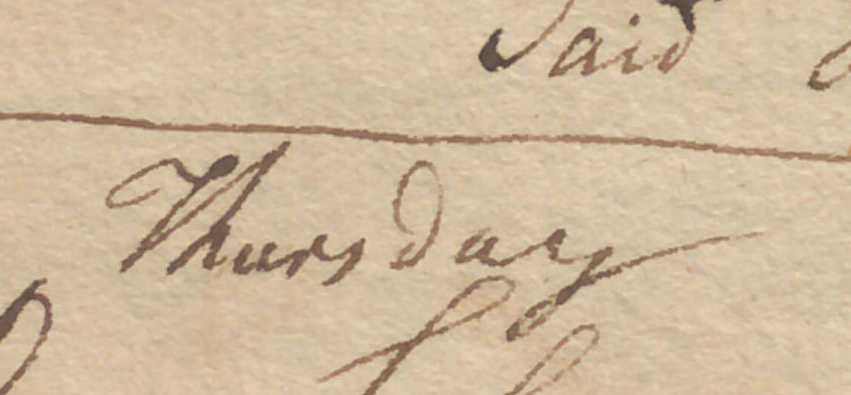Thursday
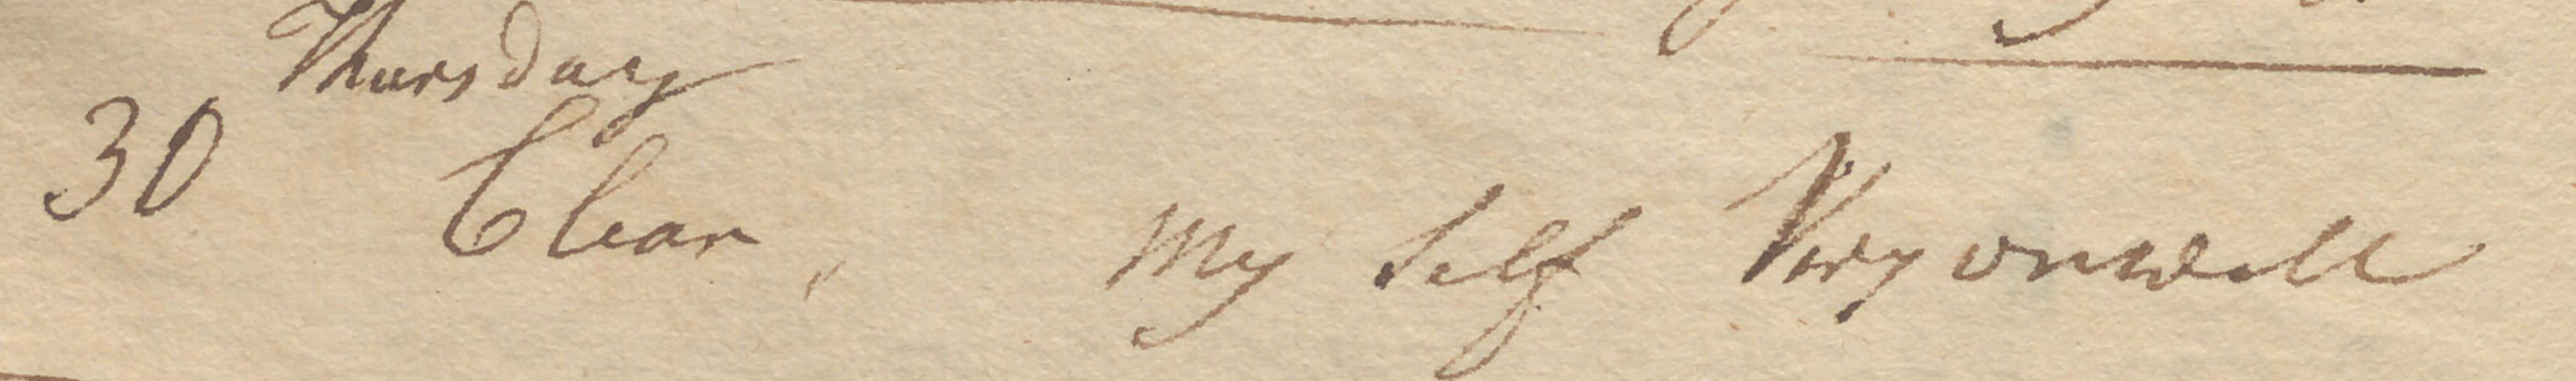30 Clear My Self Very unwell
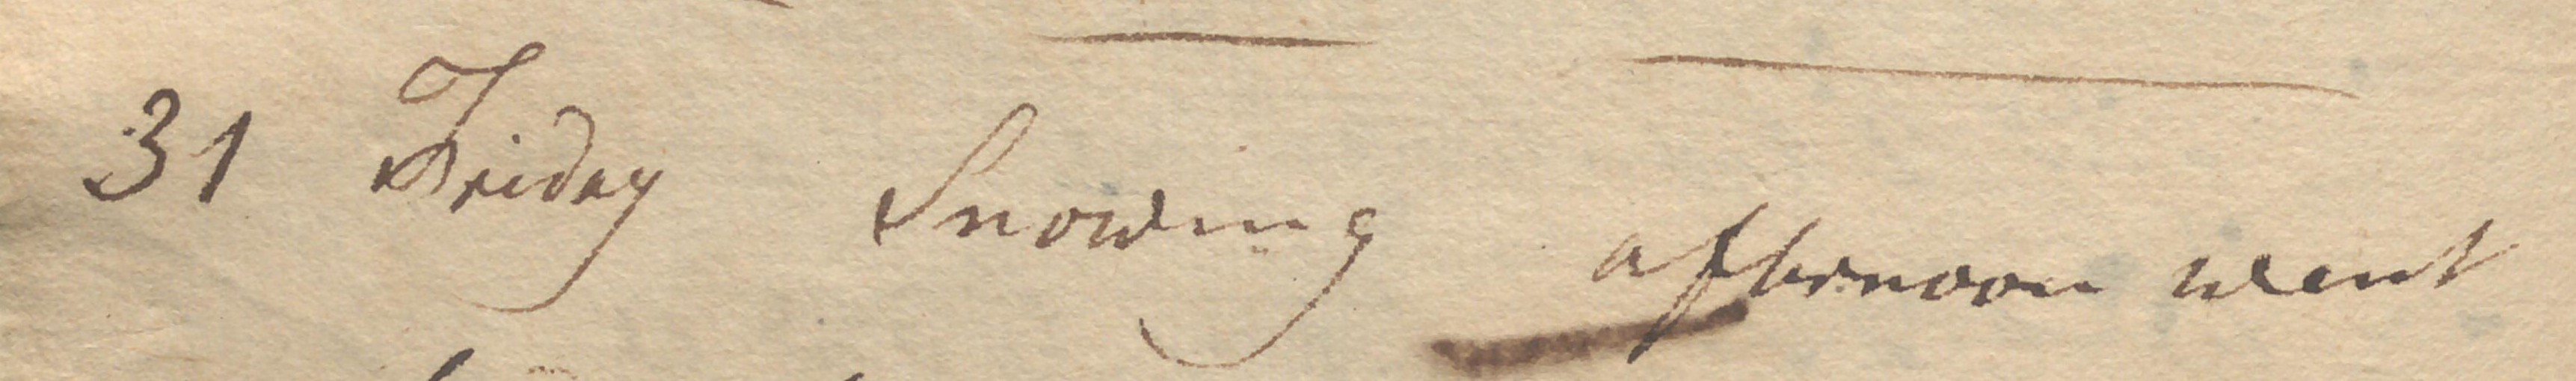31 Friday Snowing afternoon went
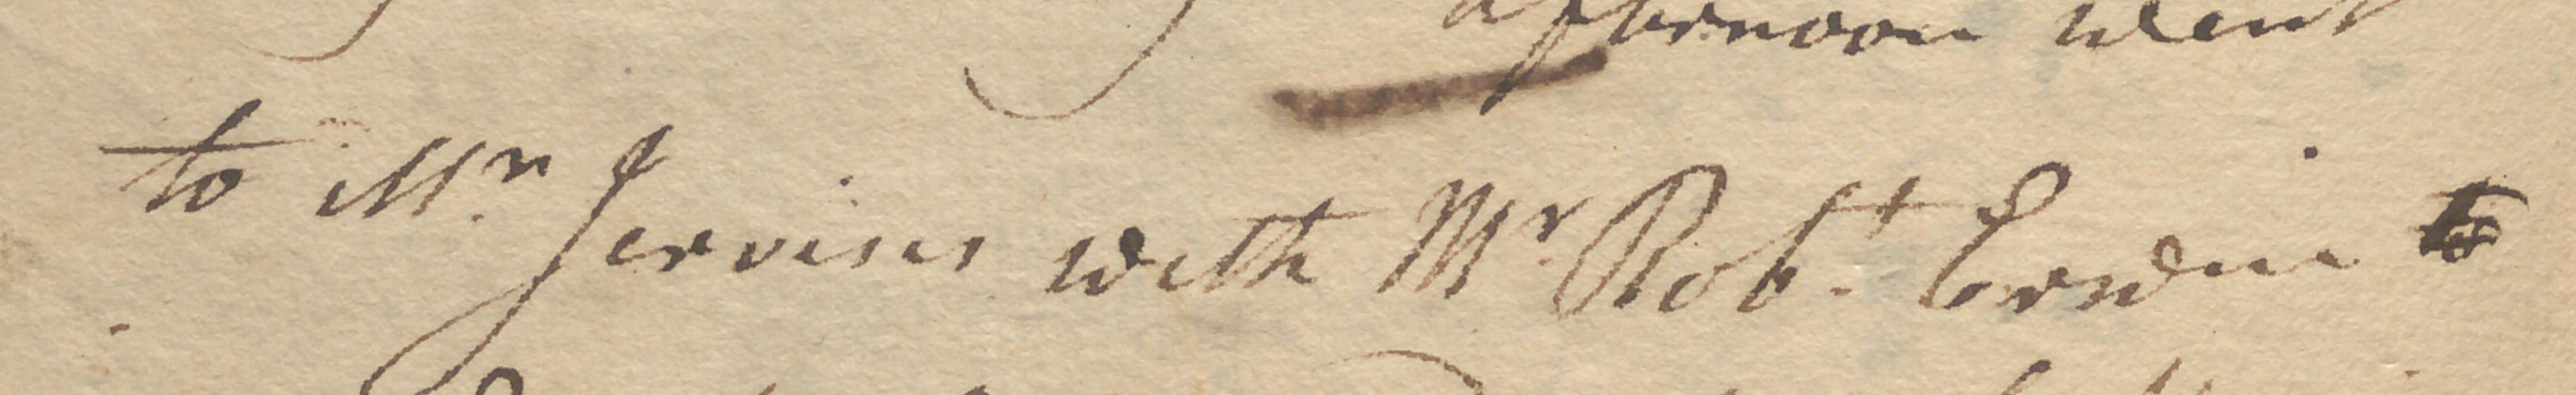to M^r. Jervises with M^r. Rob^t. Erwin [to]
